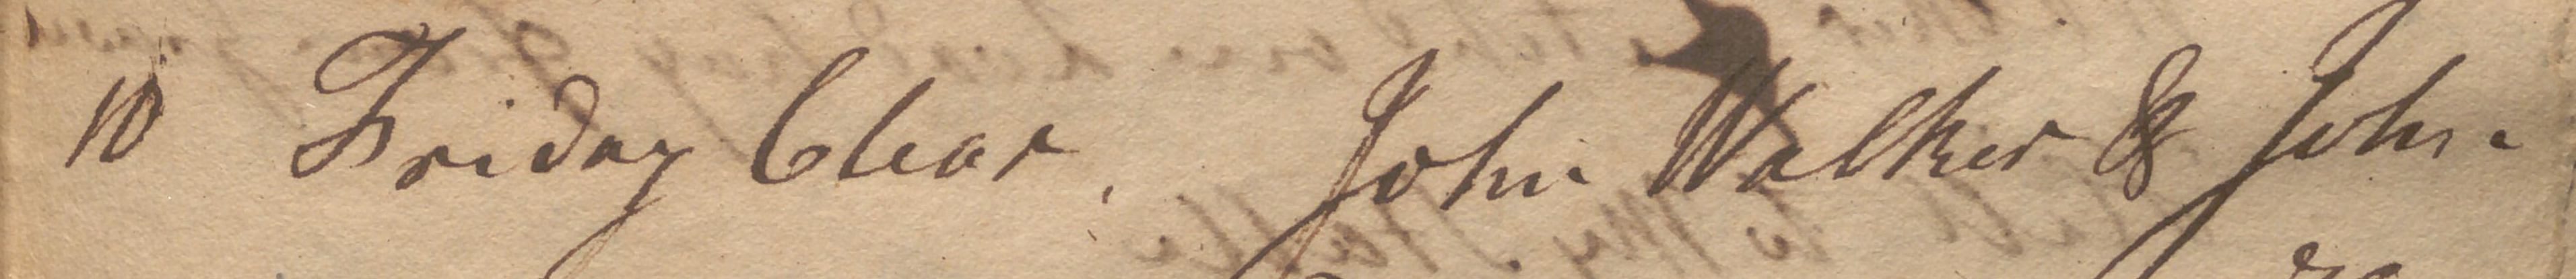1 Friday Clear. John Walker & John
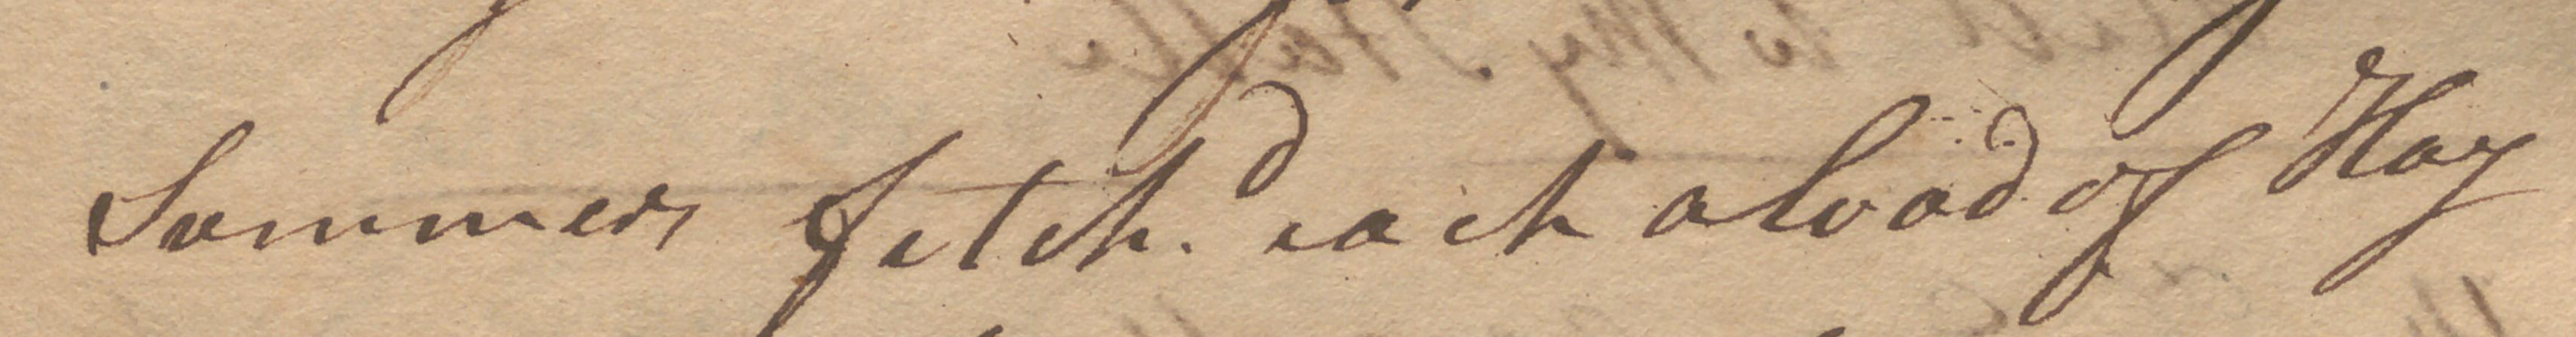Summers fetch^d. each a load of Hay
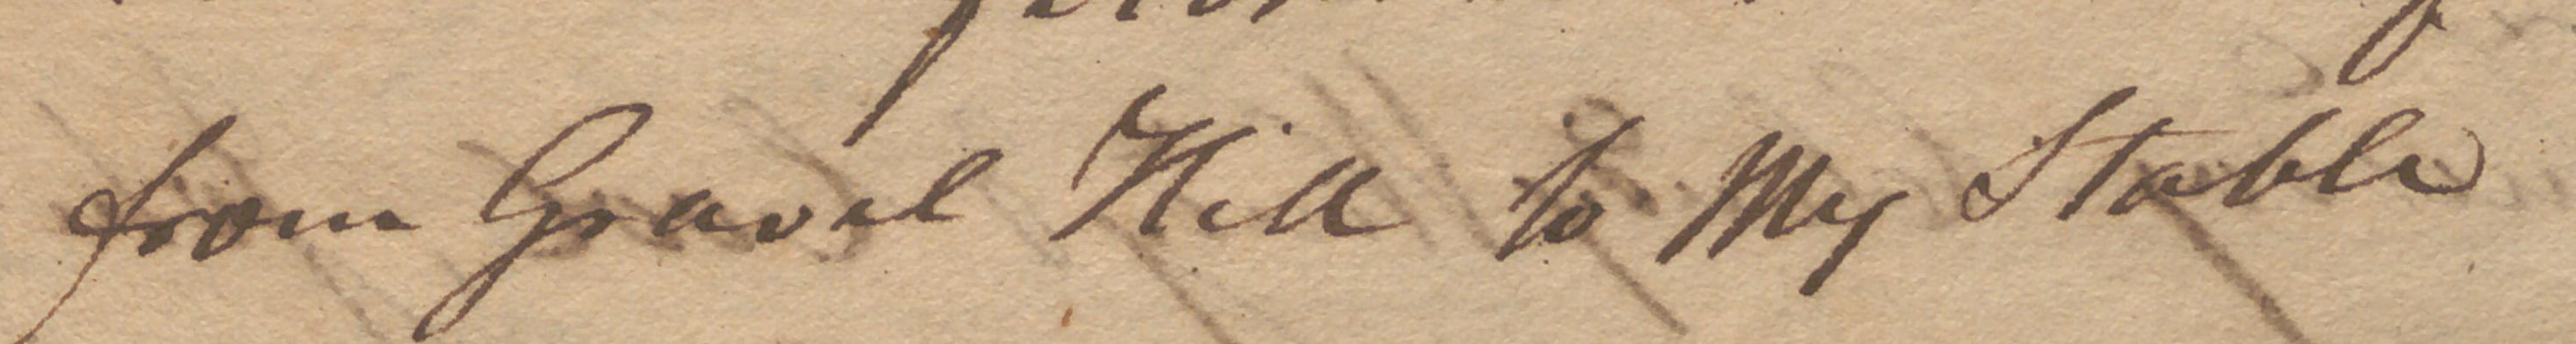from Gravel Hill to My Stable
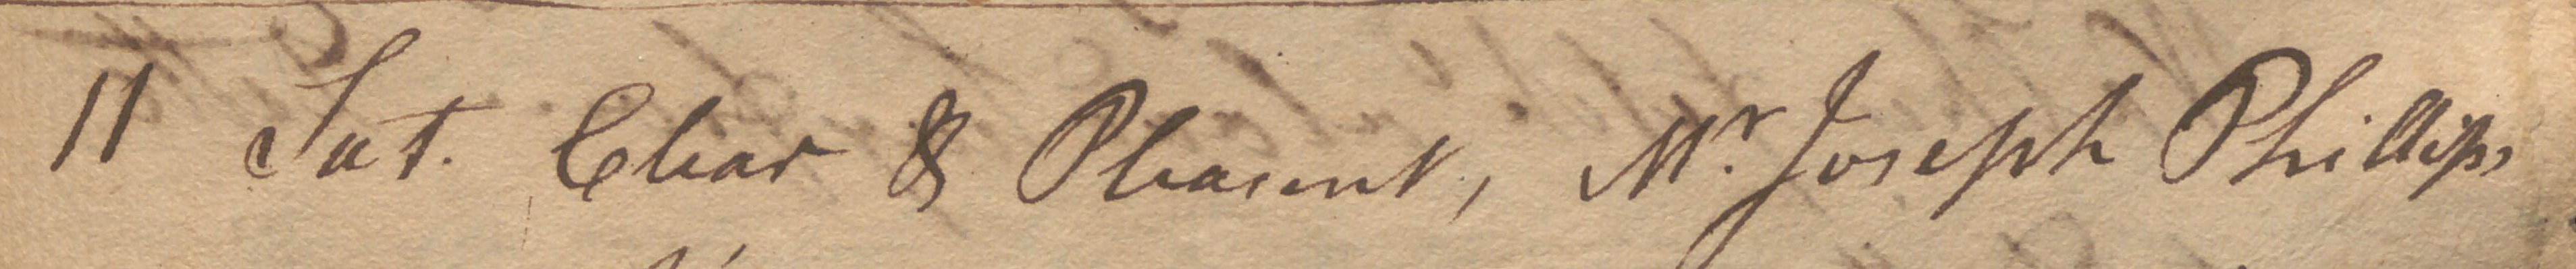11 Sat. Clear & Pleasent, M^r. Joseph Phillips
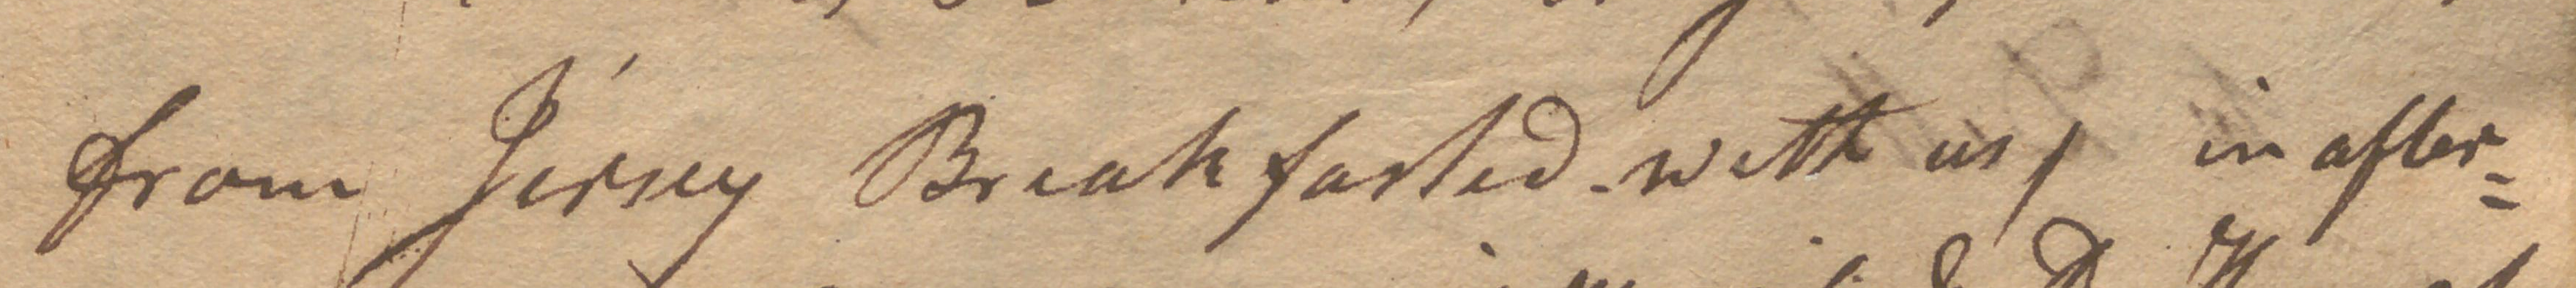from Jersey Breakfasted with us, in after-
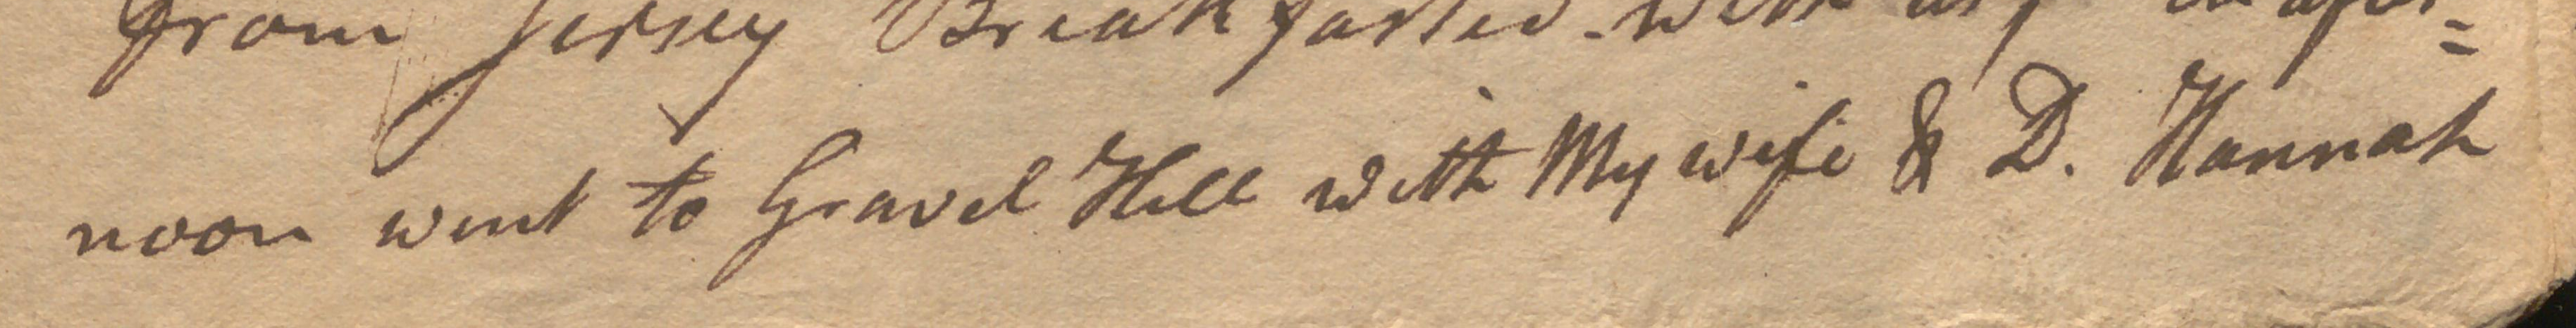noon went to Gravel Hill with My wife & D. Hannah
